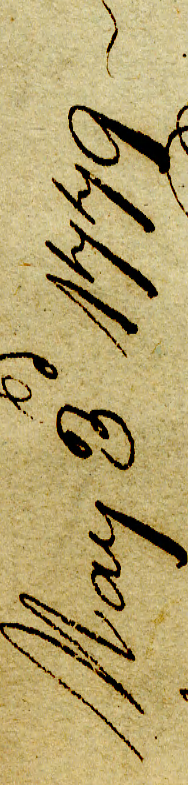May 3^d 1779
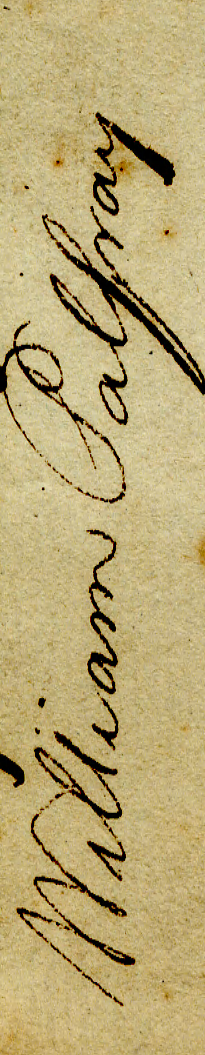William Palfray
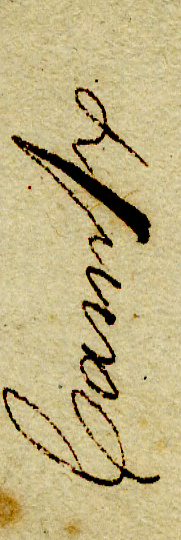Camp
